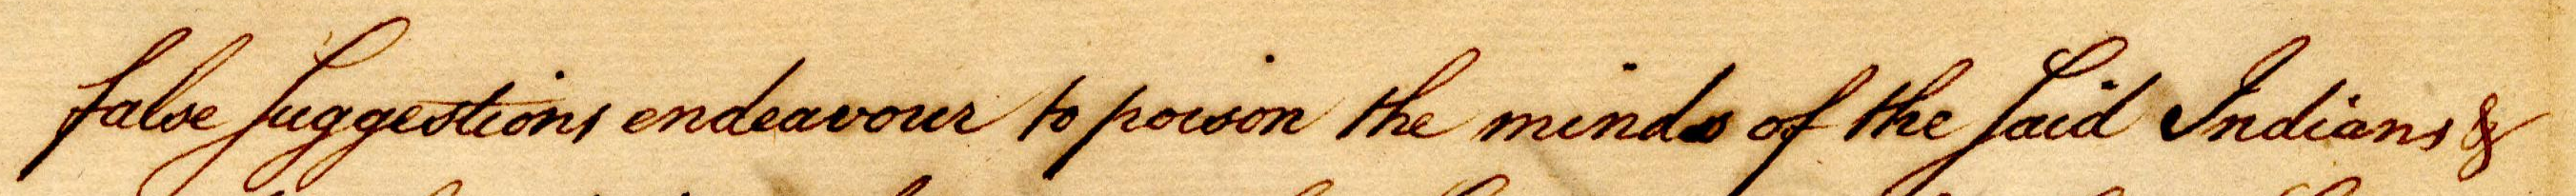false suggestions endeavour to poison the minds of the said Indians &
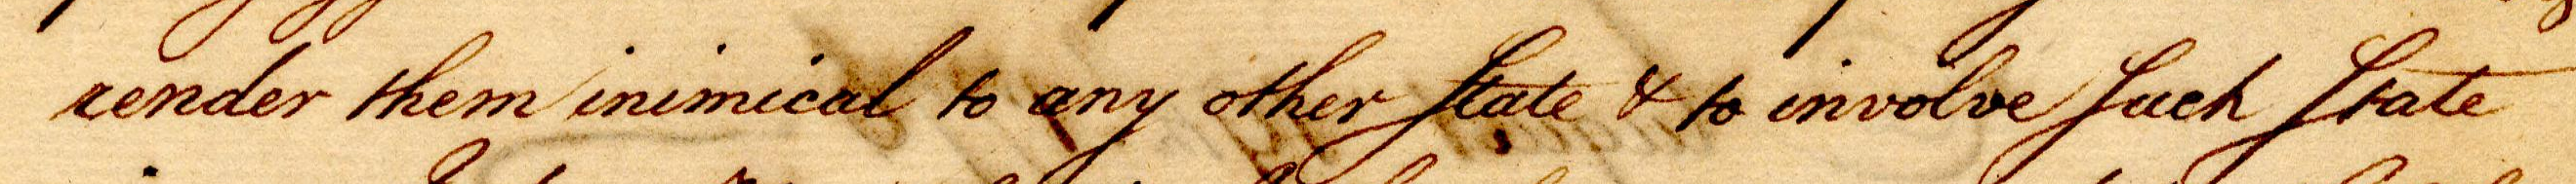render them inimical to any other State & to involve such State
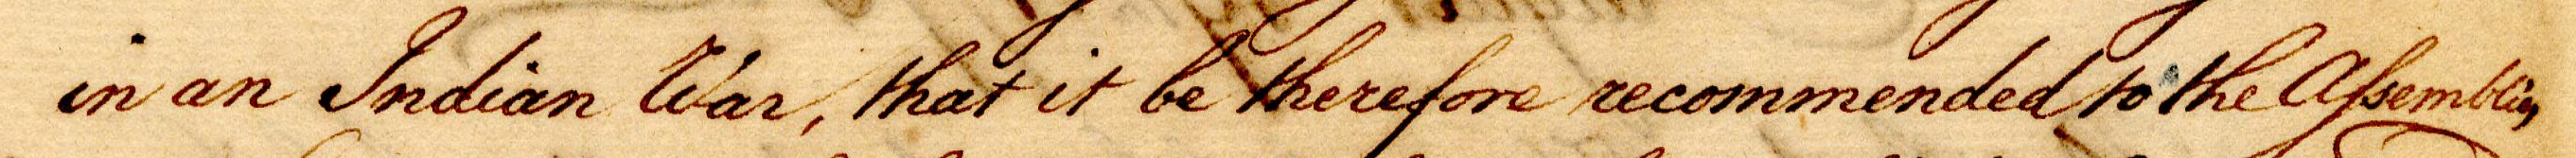in an Indian War, that it be therefore recommended to the Assemblies
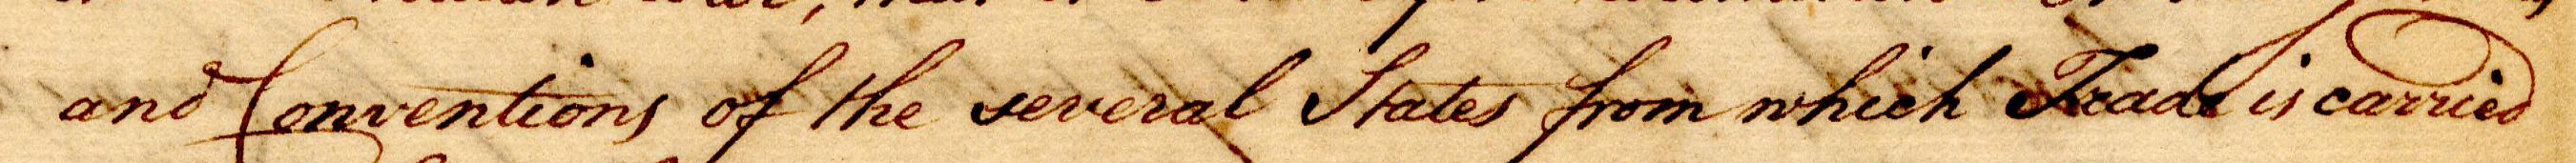and Conventions of the several States from which Trade is carried
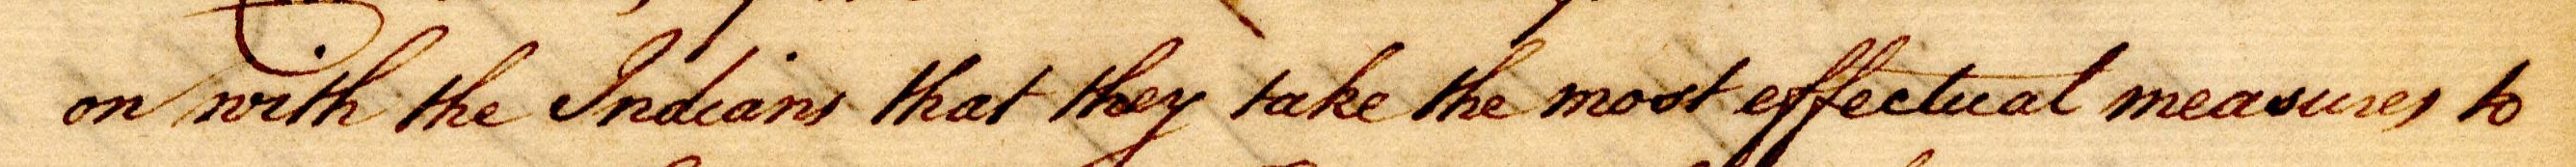on with the Indians that they take the most effectual measures to
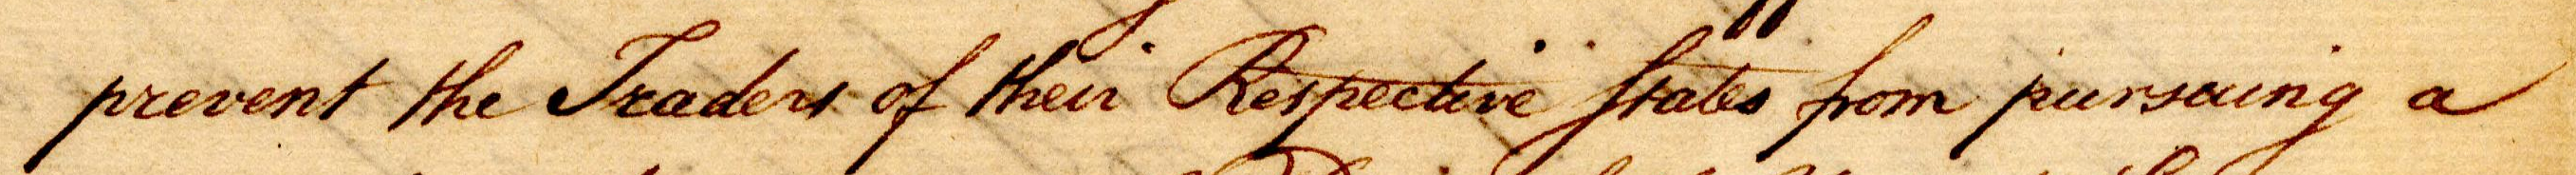prevent the Traders of their Respective States from pursuing a
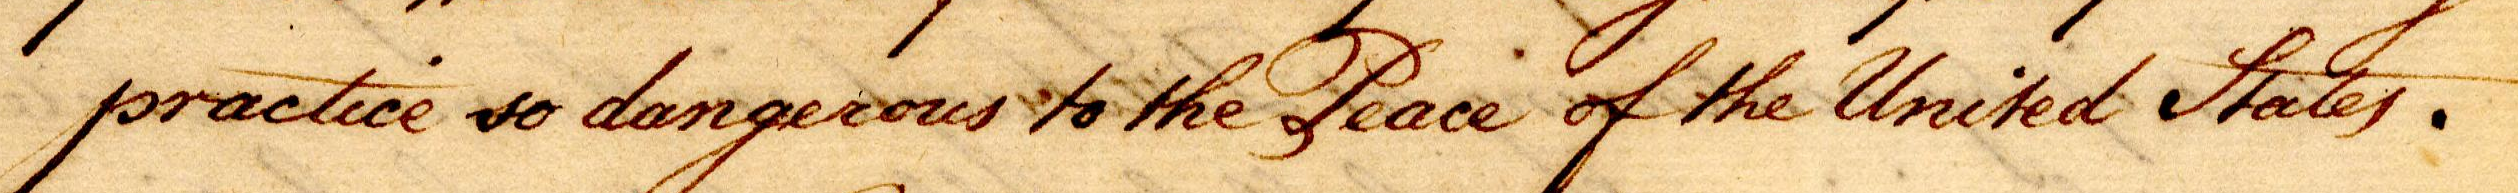practice so dangerous to the Peace of the United States.
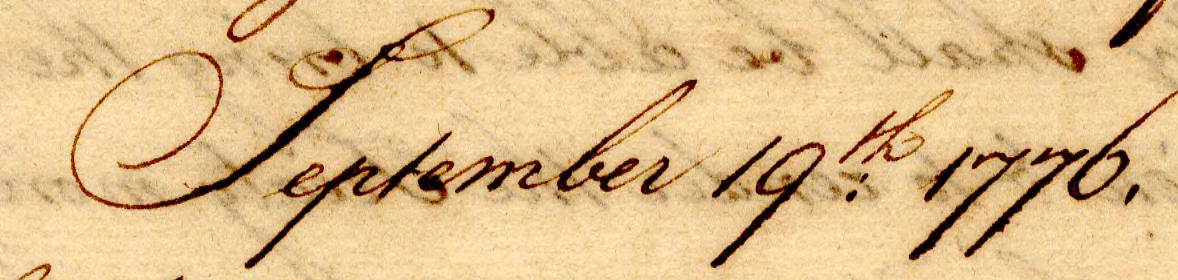September 19^th. 1776.
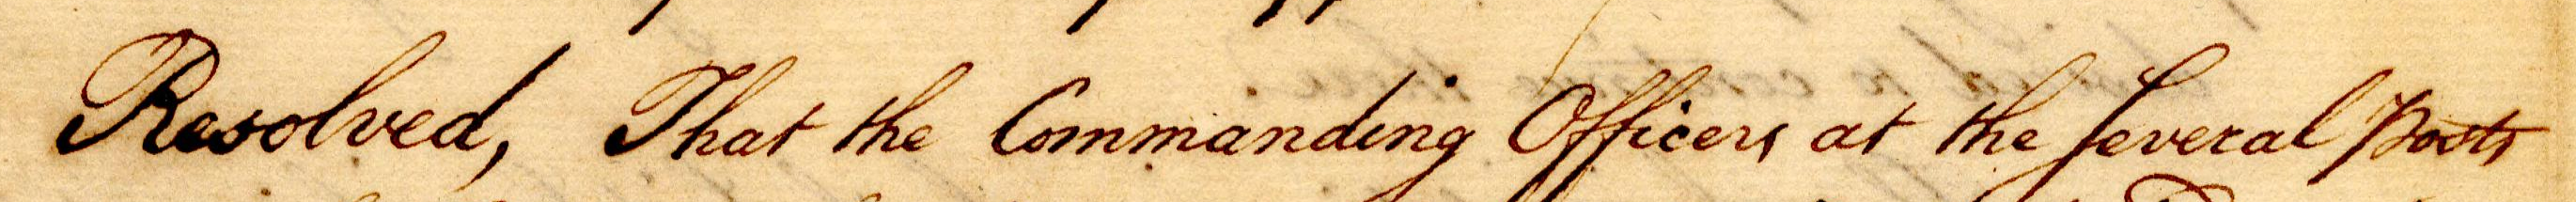Resolved, That the Commanding Officers at the Several posts
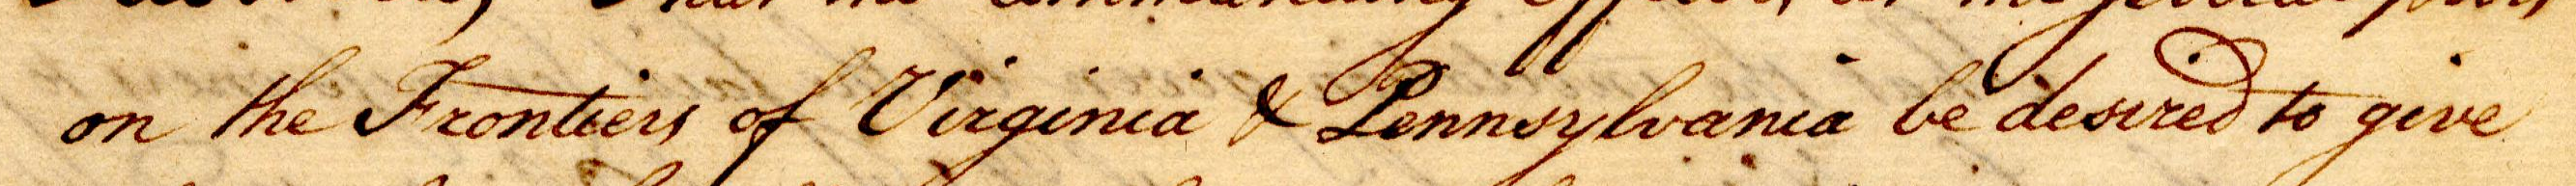on the Frontiers of Virginia & Pennsylvania be desired to give
